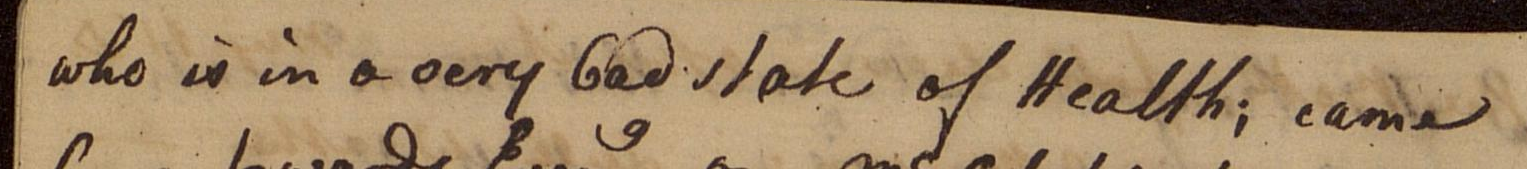who is in a very bad state of Health; came
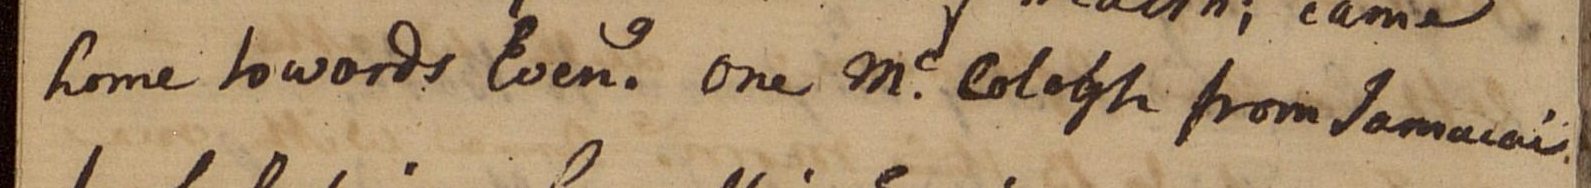home towards Even^g. one M^c. Colegh from Jamacai
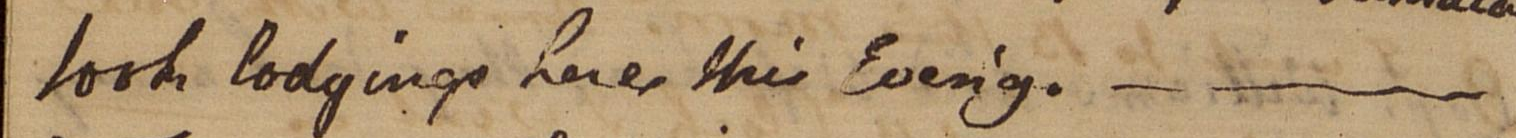took lodgings here this Even'g.-
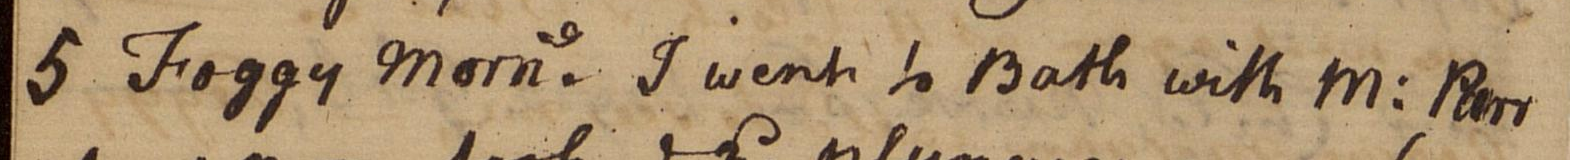5 Foggy Morn^g. I went to Bath with M: Parr
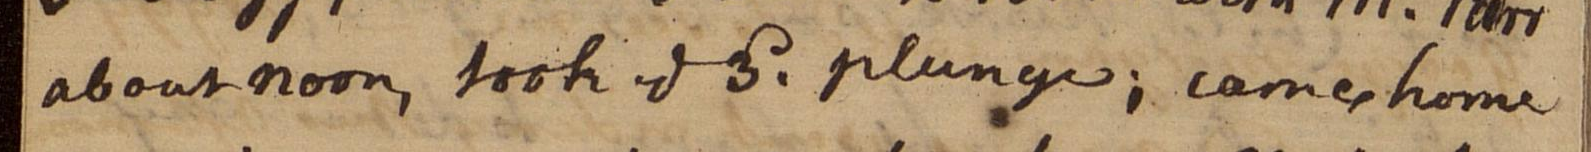about noon, took y^e 3^d. plunge, came home
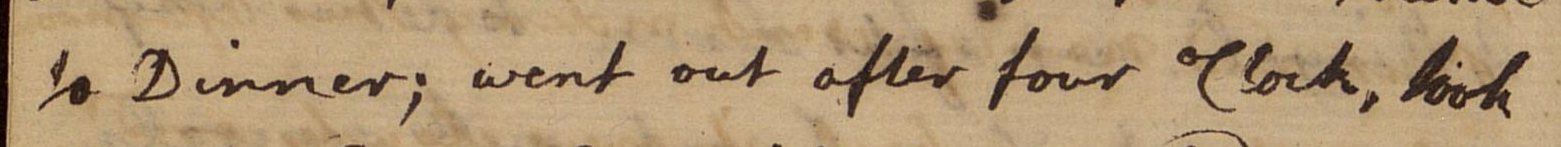to Dinner; went out after four ^o Clock, took
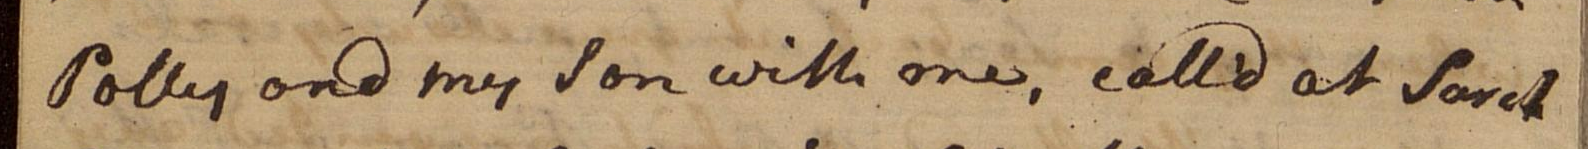Polly and my Son with me, call'd at Sarah
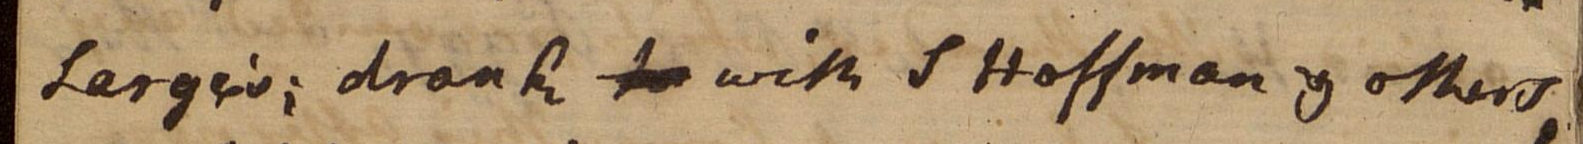Large's; drank [to] with S Hoffman & others
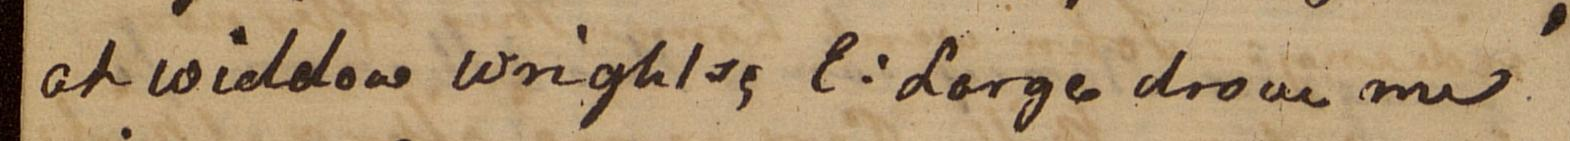at widdow Wrights; E: Large drove me
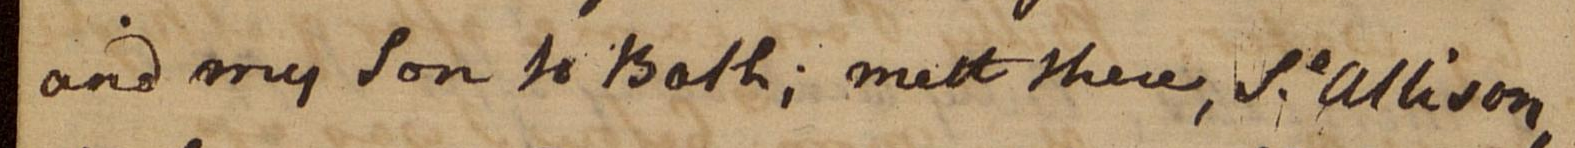and my Son to Bath; mett there, S^o. Allison,
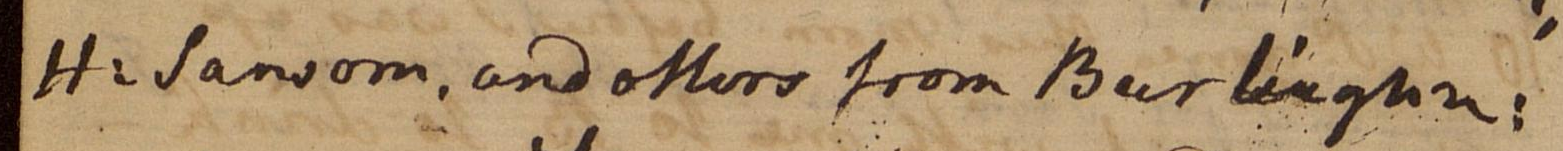H: Sansom, and others from Burlington:
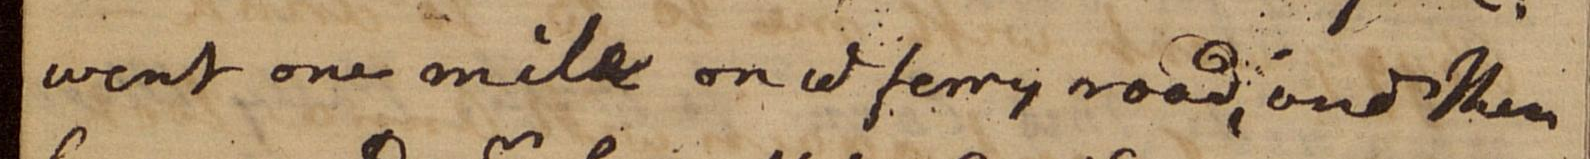went one mile on y^e ferry road. and then
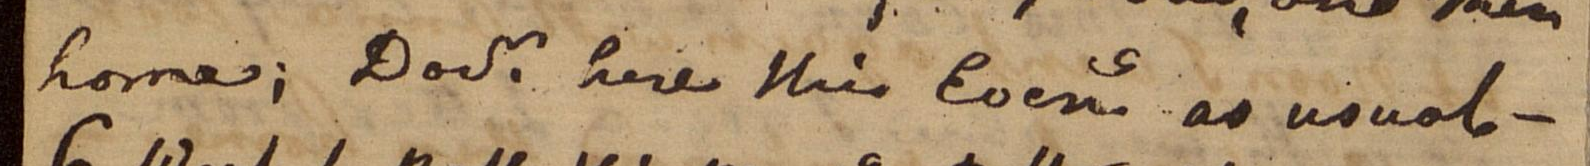home; Doc^r. here this Even^g as usual-
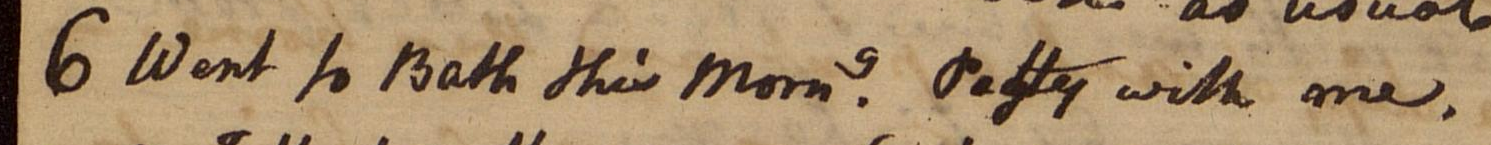6 Went to Bath this Morn^g. Patty with me.
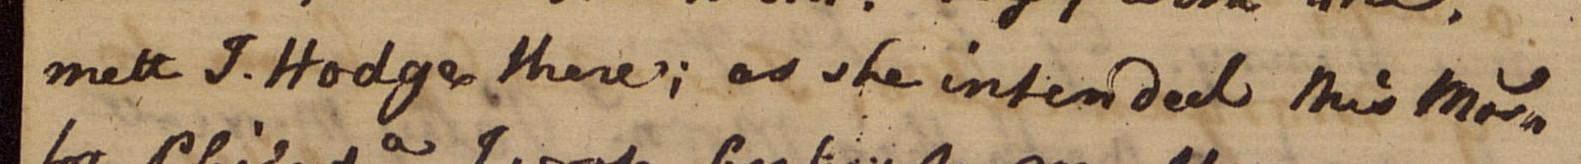mett T. Hodge there; as she intended this Morn^g
